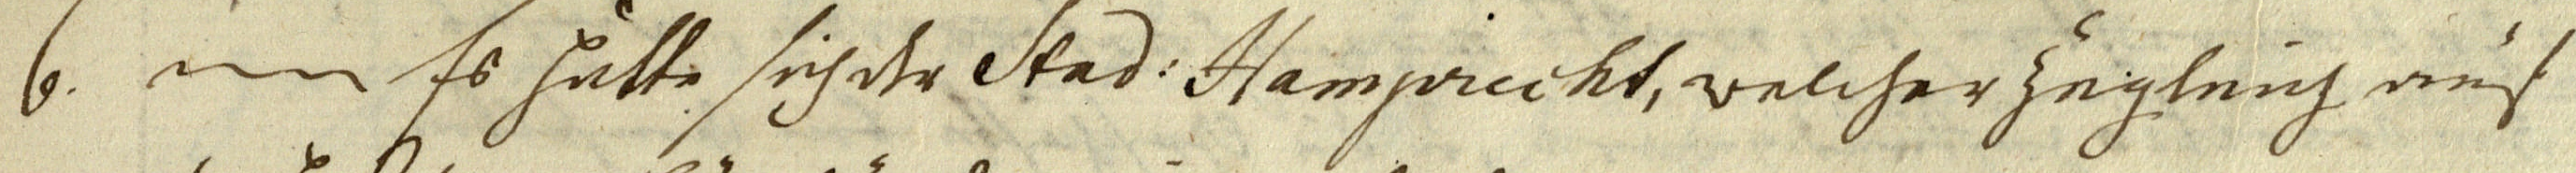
6. Es hätte sich der Stud. Hamprecht, welcher zugleich auf
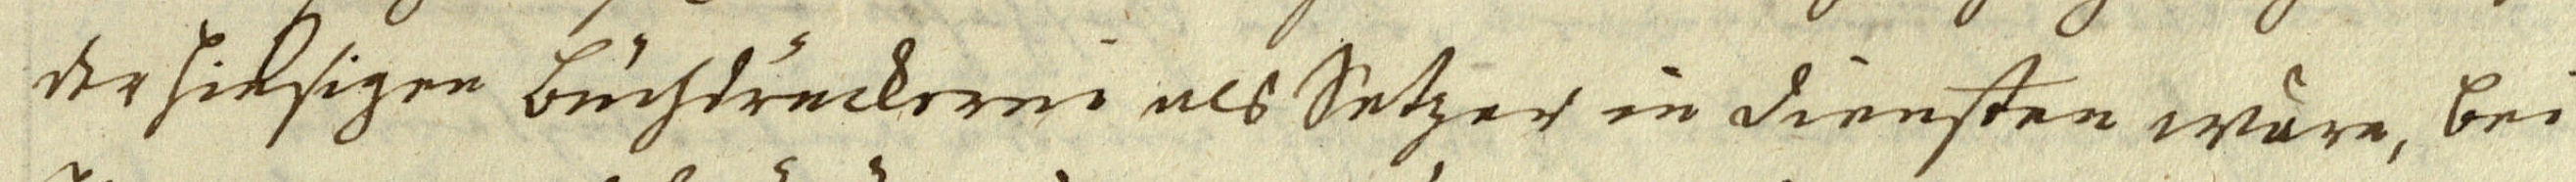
der hiesigen Buchdruckerei als Setzer in Diensten wäre, bei
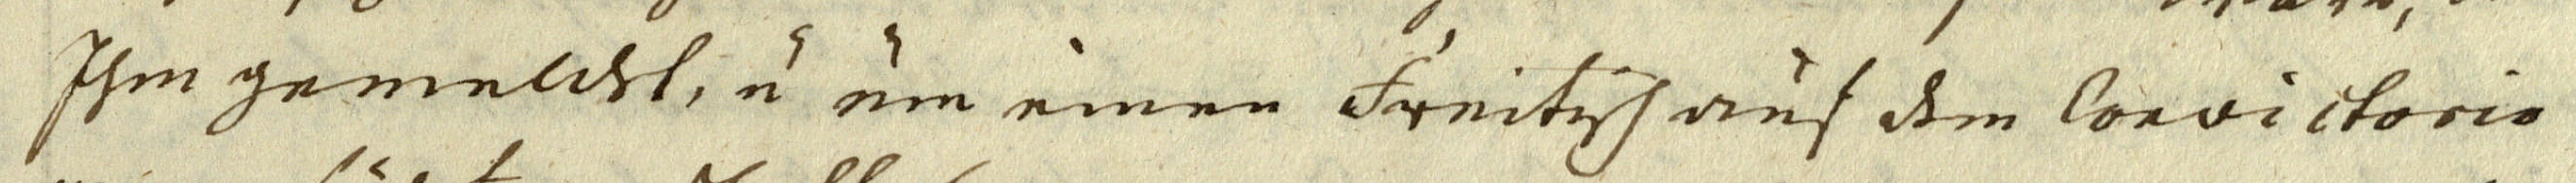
Ihm gemeldet, u um einen Freitisch auf dem Convictorio
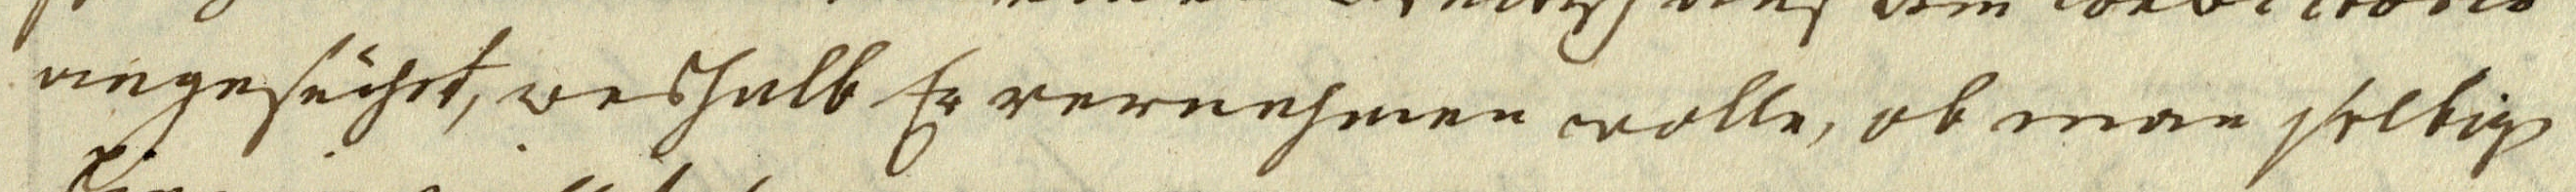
angesuchet, weshalb Er vernehmen wolle, ob man selbig
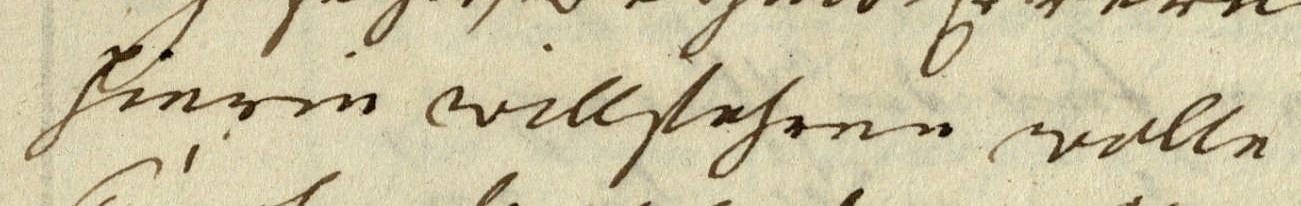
hierin willfahren wolle.
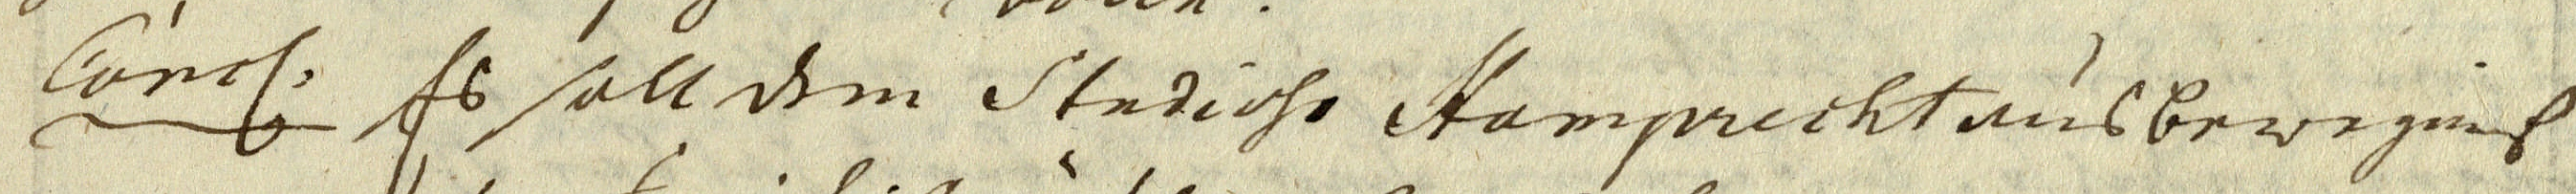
Concl. Es soll dem Studioso Hamprecht aus bewegniß
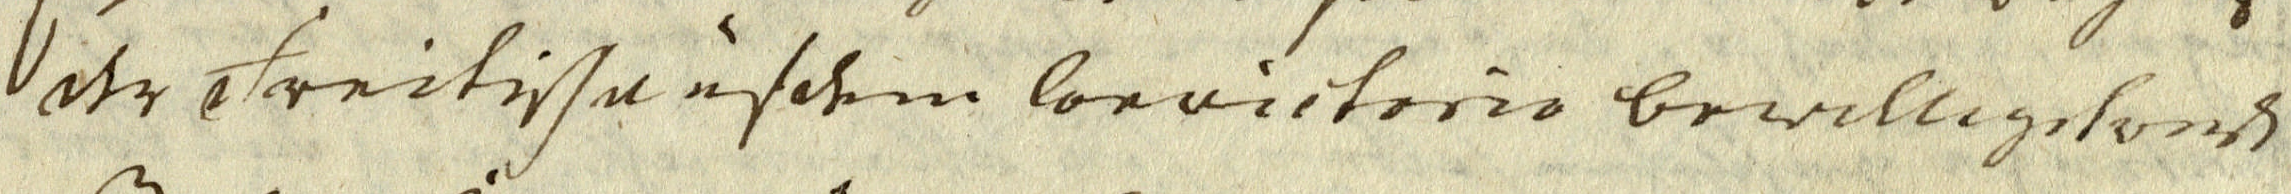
der Freitische auf dem Convictorio bewilliget werden
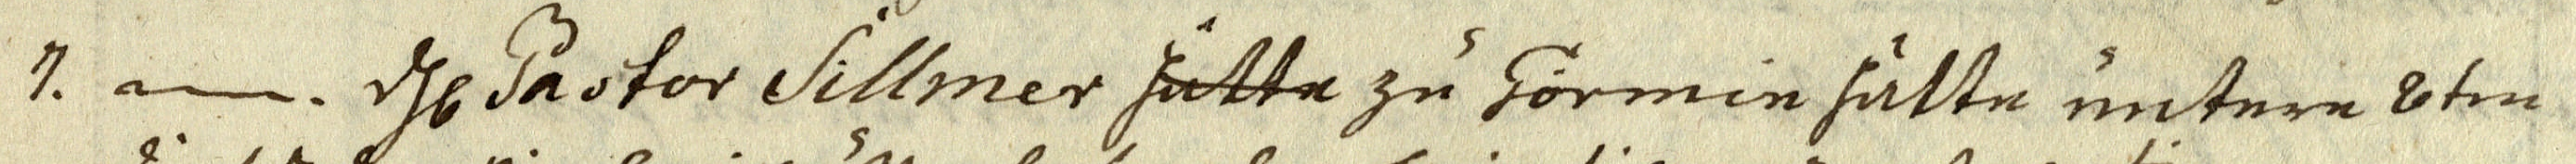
7. dh. Pastor Sillmer hätte zu Görmin hätte untern 8 ten
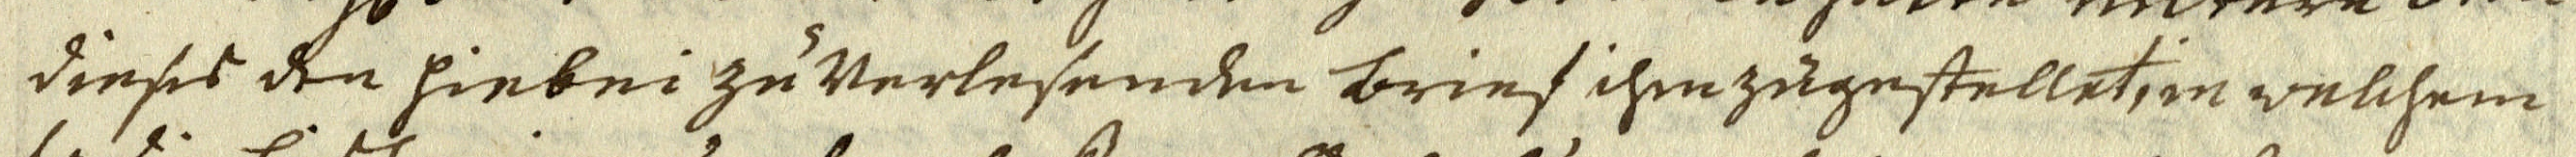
dieses den hiebei zuverlesenden Brief ihm zugestellet, in welchem
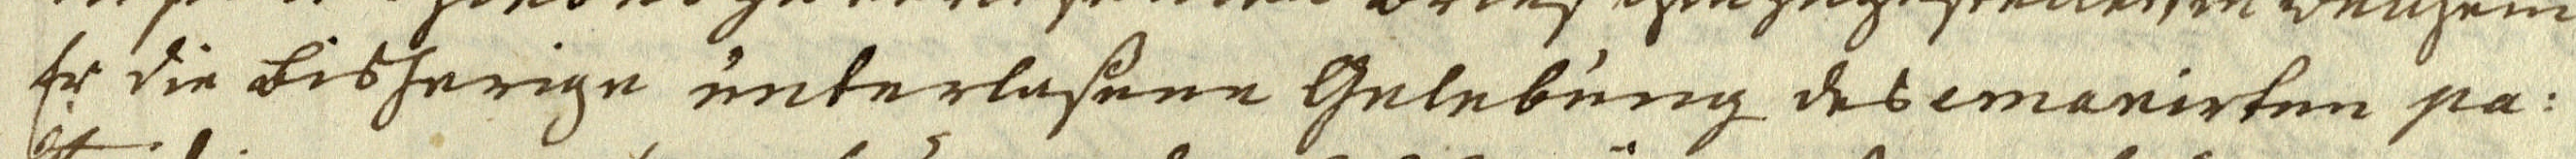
Er die bisherige unterlaßene Gelebung des emanirten pa¬
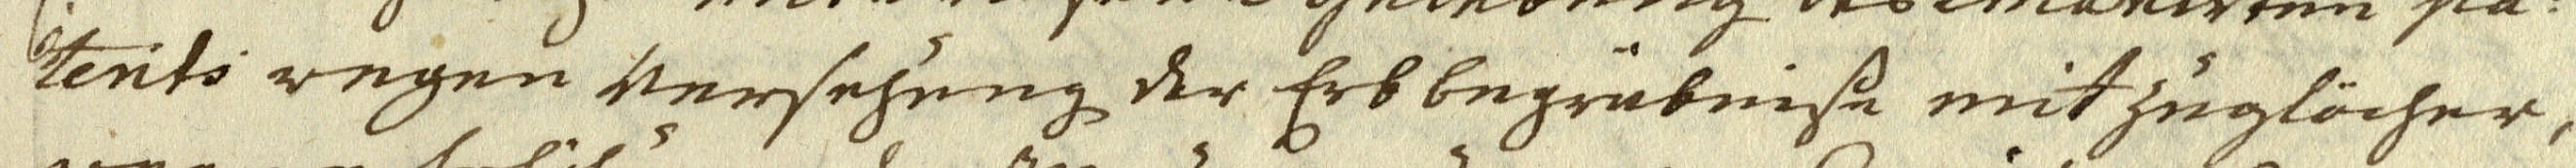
tents wegen Versehung der Erb begräbniße mit Zuglöcher,
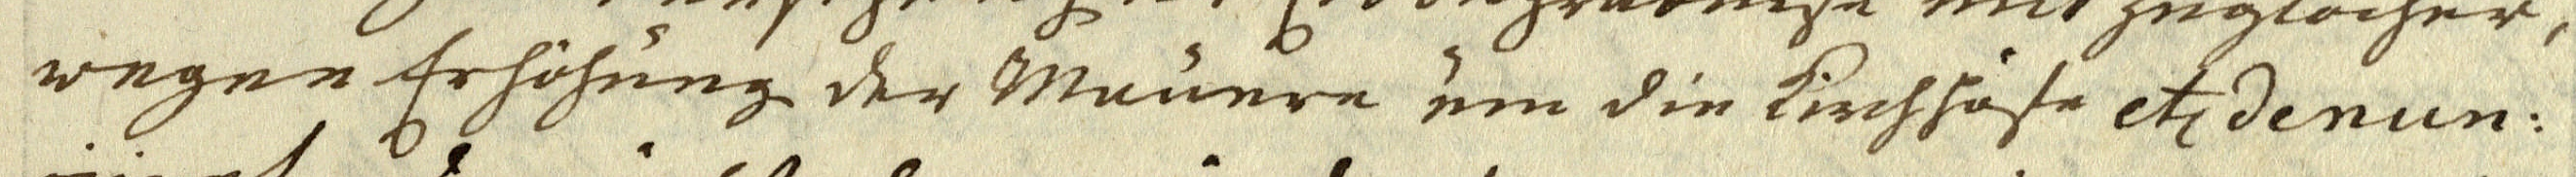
wegen Erhöhung der Mauern um die Kirchhöfe et. denun¬
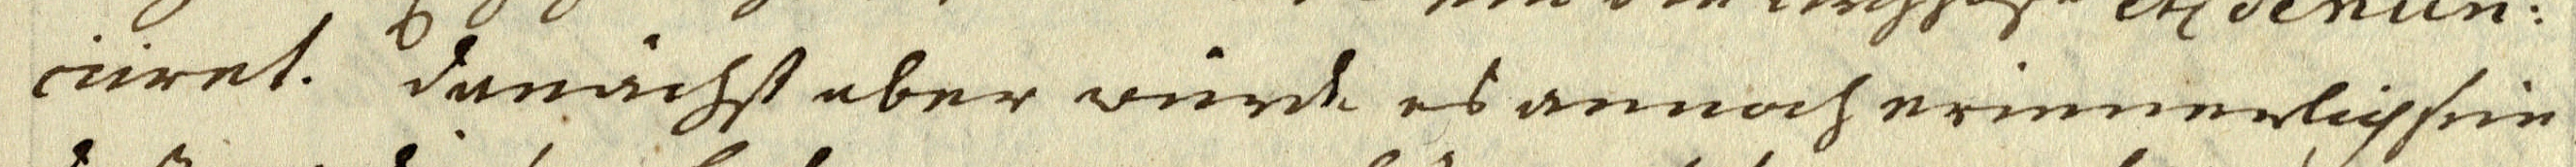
ciiret. Danächst aber würde es annoch erinnerlich sein,
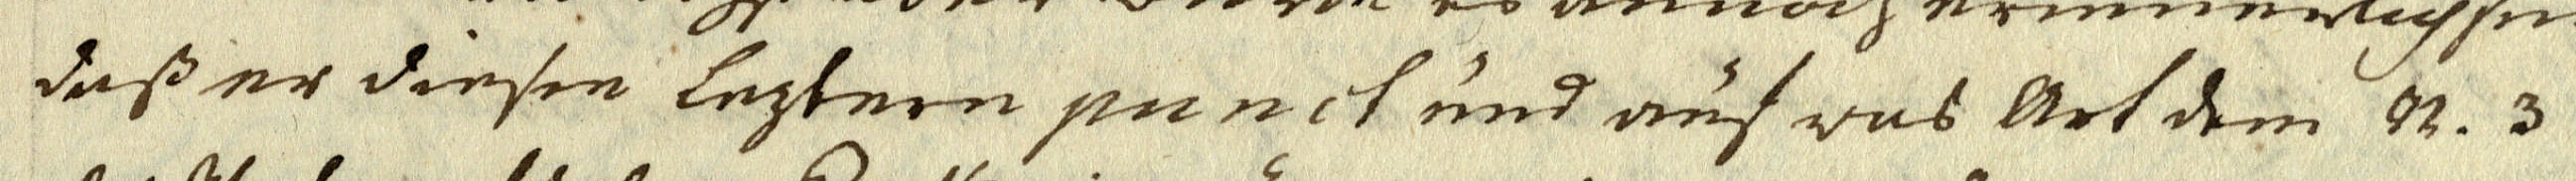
daß er diesen leztern punct und auf wes Art dem N. 3
